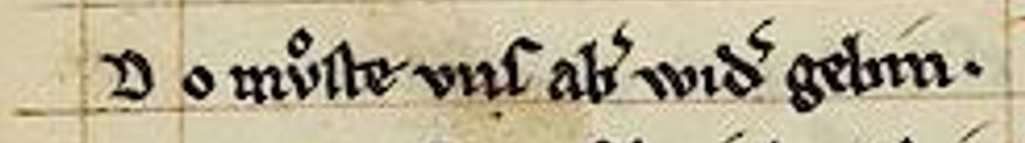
Do mv°oſte vnſ ab(er) wid(er) gebin.
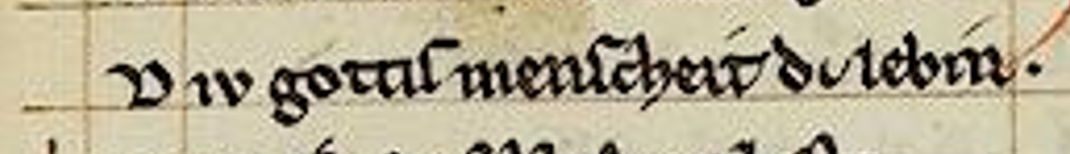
Div gottiſ menſcheit d(az) lebin.
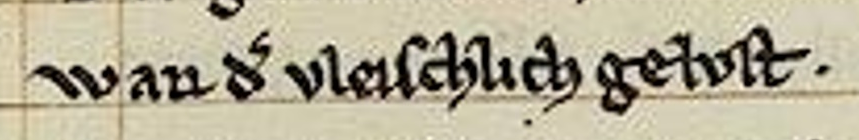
Wan d(er) vleiſchlich gelvſt.
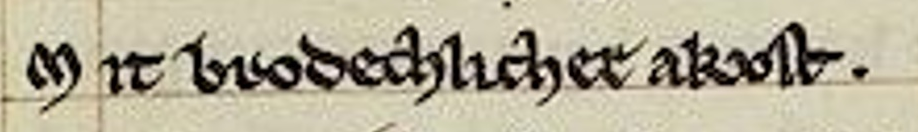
Mit brodechlicher akvſt.
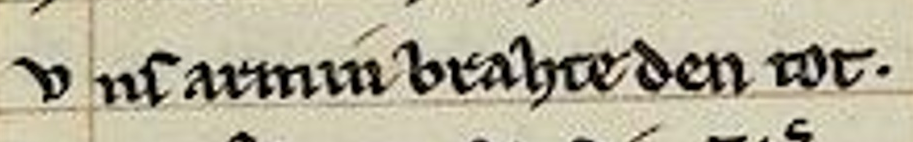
Vnſ armin brahte den tot.
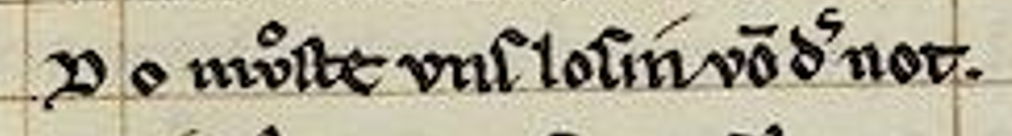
Do mv°oſte vnſ loſin vo(n) d(er) not.
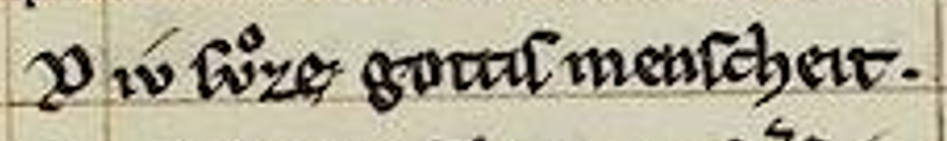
Div ſv°oze gottiſ menſcheit.
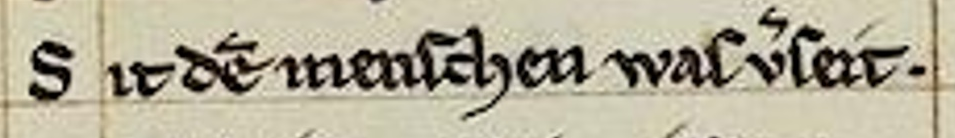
Sit de(m) menſchen waſ v(er)ſeit.
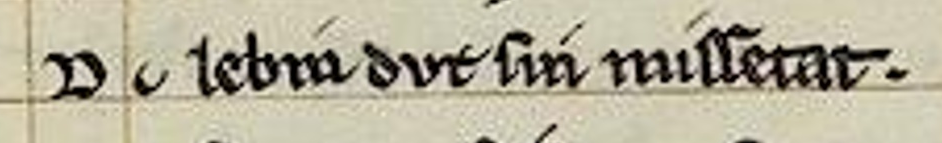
D(az) lebin dvr ſin miſſetat.
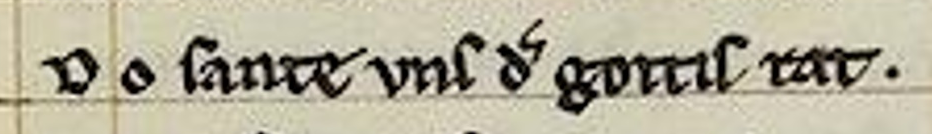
Do ſante vnſ d(er) gottiſ rat.
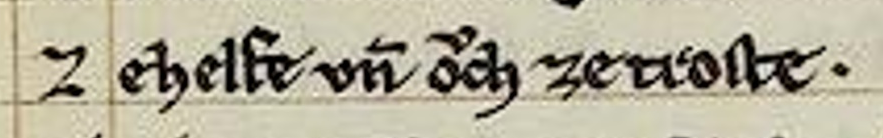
Zehelfe vn(d) o°vch ze troſte.
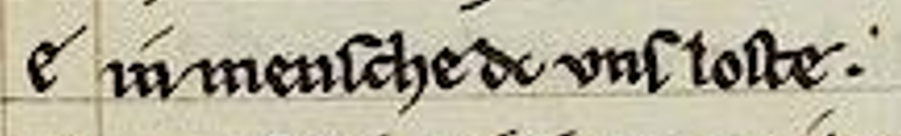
Ein menſche d(az) vnſ loſte.
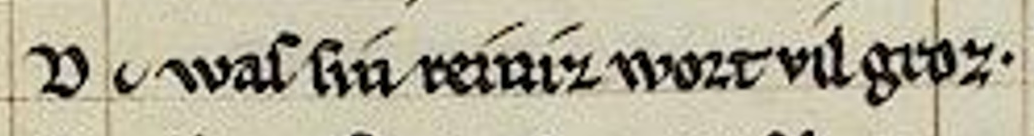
D(az) waſ ſin reiniz wort vil groz.
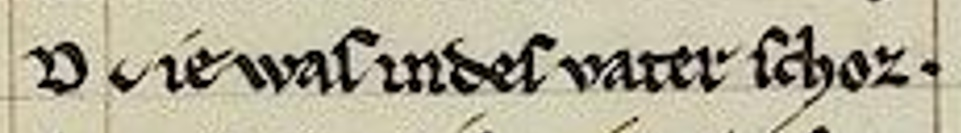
D(az) ie waſ indeſ vater ſchoz.
